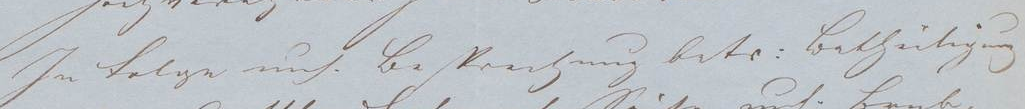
In Folge uns. Besprechung betr. Betheiligung
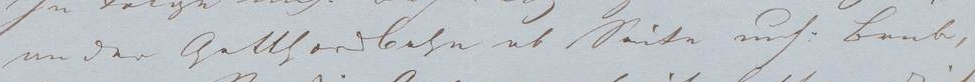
an der Gotthardbahn ab Seite uns. Bank,
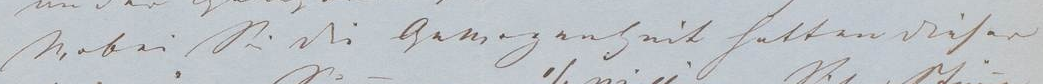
wobei Sie die Gewogenheit hatten dieser
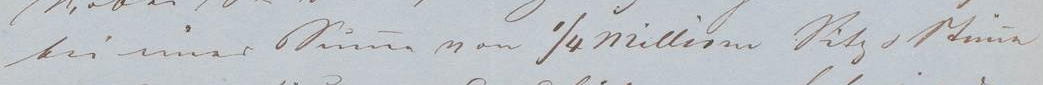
bei einer Summe von ¼ Million Sitz & Stimme
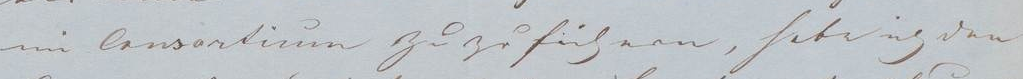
im Consortium zuzusichern, habe ich den
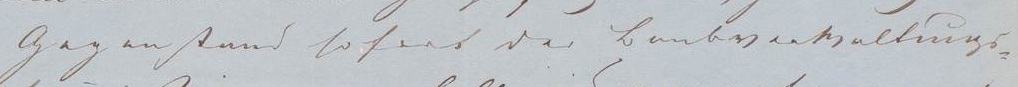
Gegenstand sofort der Bankverwaltungs-
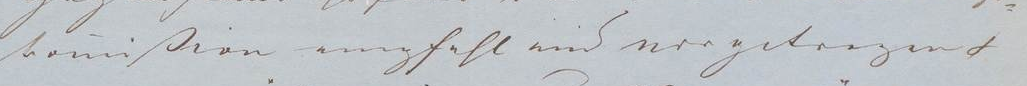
kommißion empfehlend und vorgetragen &
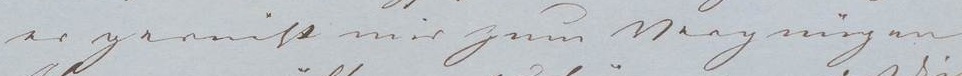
es gereicht mir zum Vergnügen
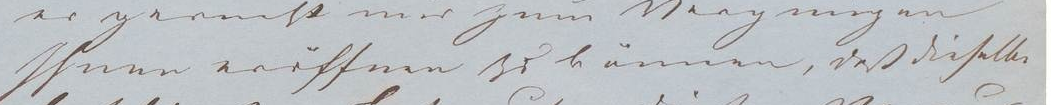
Ihnen eröffnen zu können, daß dieselbe
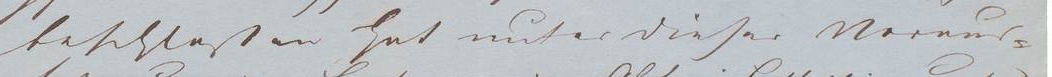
beschloßen hat unter dieser Voraus-
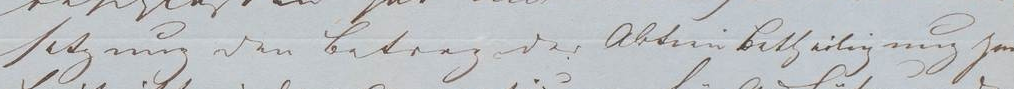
setzung den Betrag der Aktien Betheiligung zum
